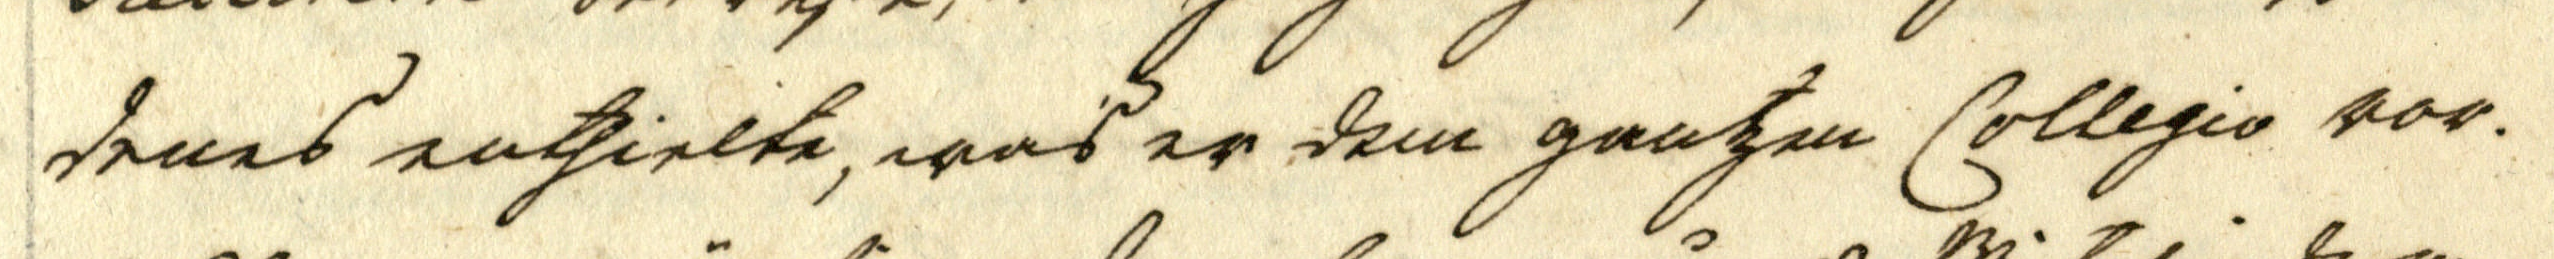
denes enthielte, was er dem gantzen Collegio vor¬
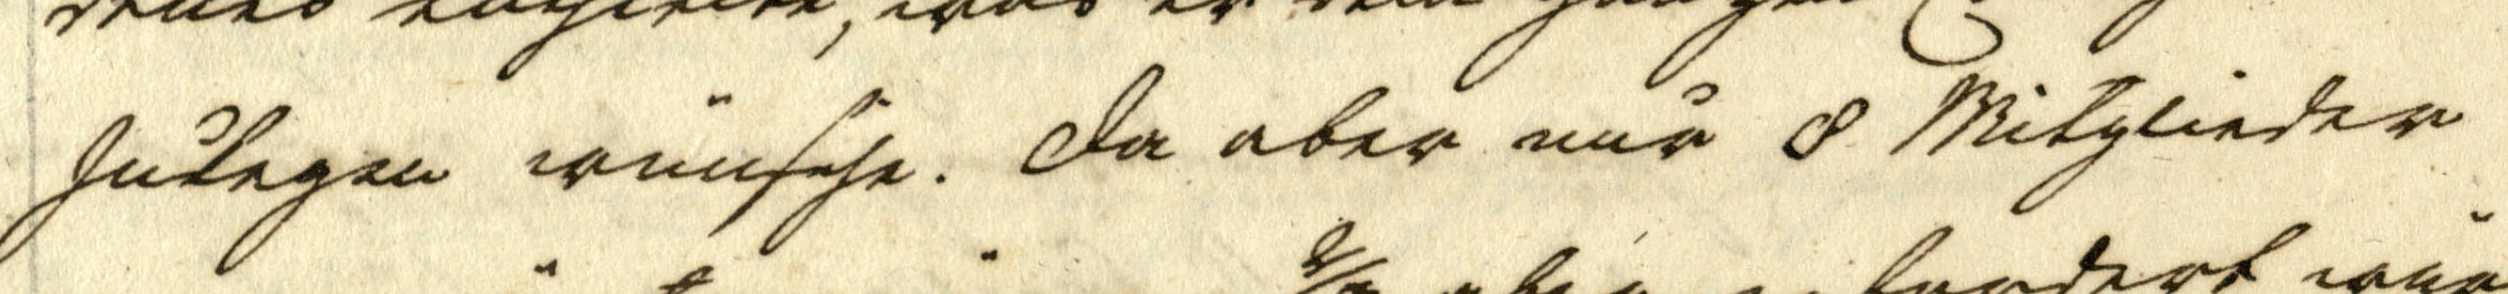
zulegen wünsche. Da aber nur 8 Mitglieder
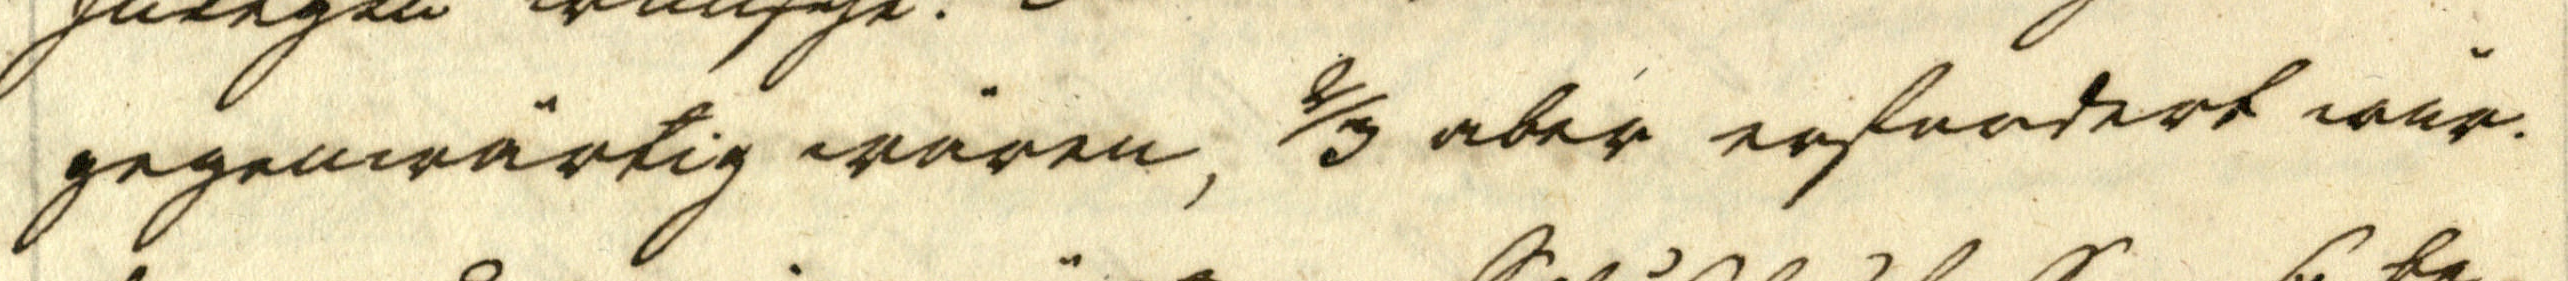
gegenwärtig wären, ²/³ aber erfordert wür¬
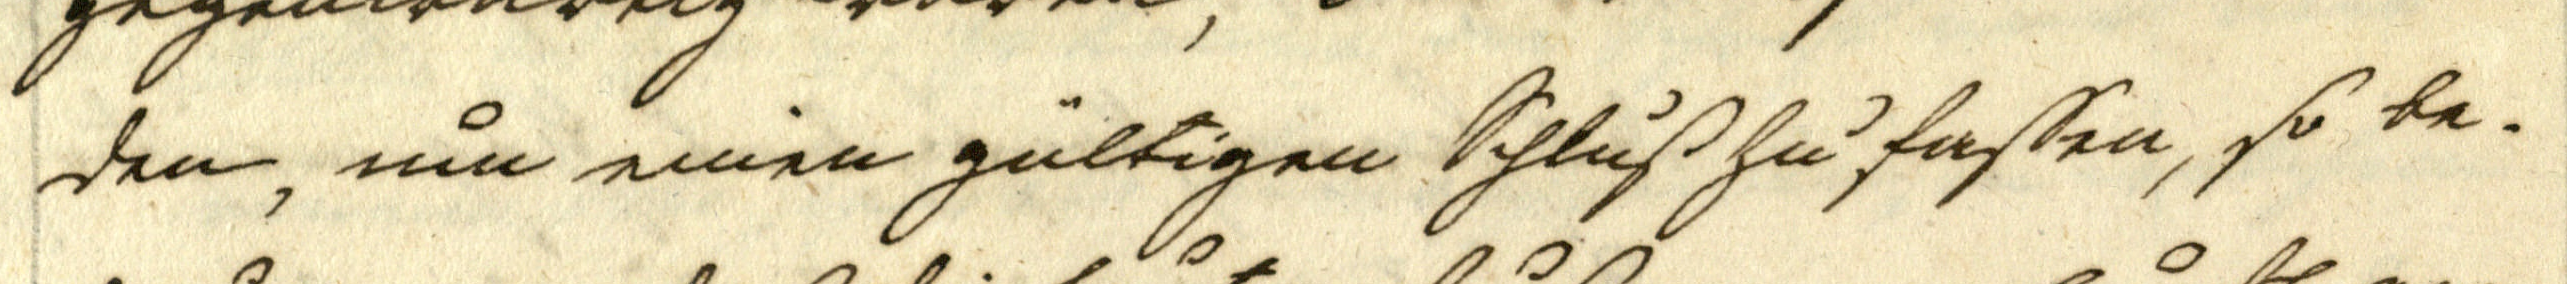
den, um einen gültigen Schluß zu fassen, so be¬
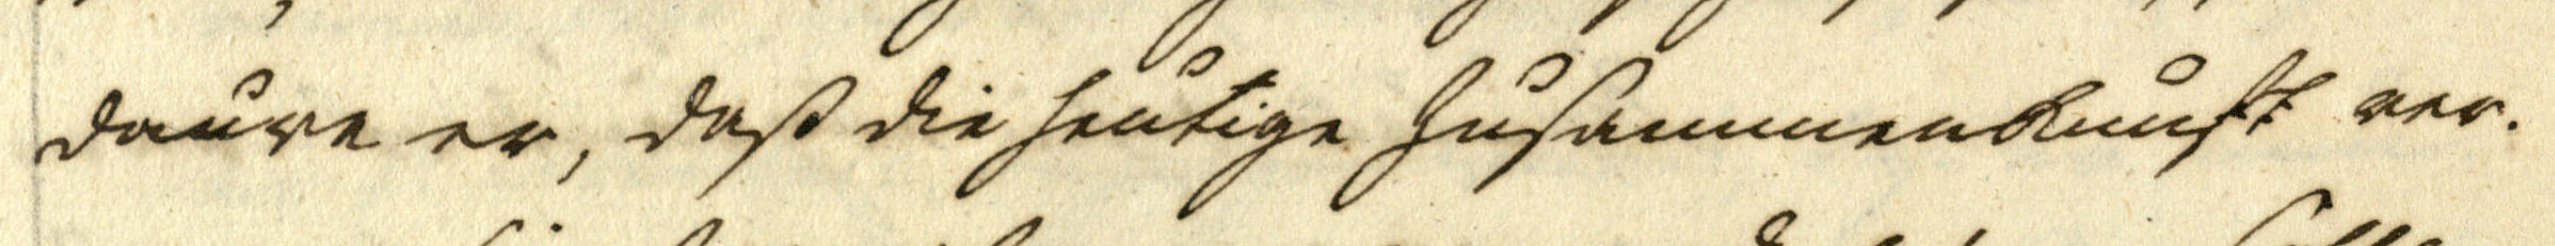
daure er, daß die heutige Zusammenkunft ver¬
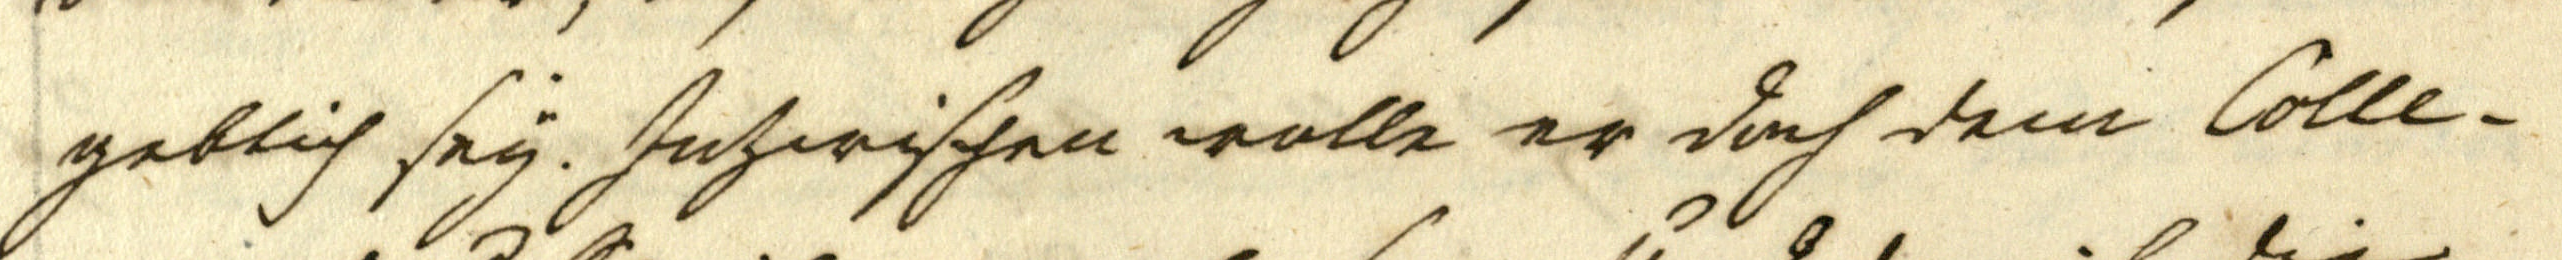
geblich seÿ. Inzwischen wolle er doch dem Colle¬
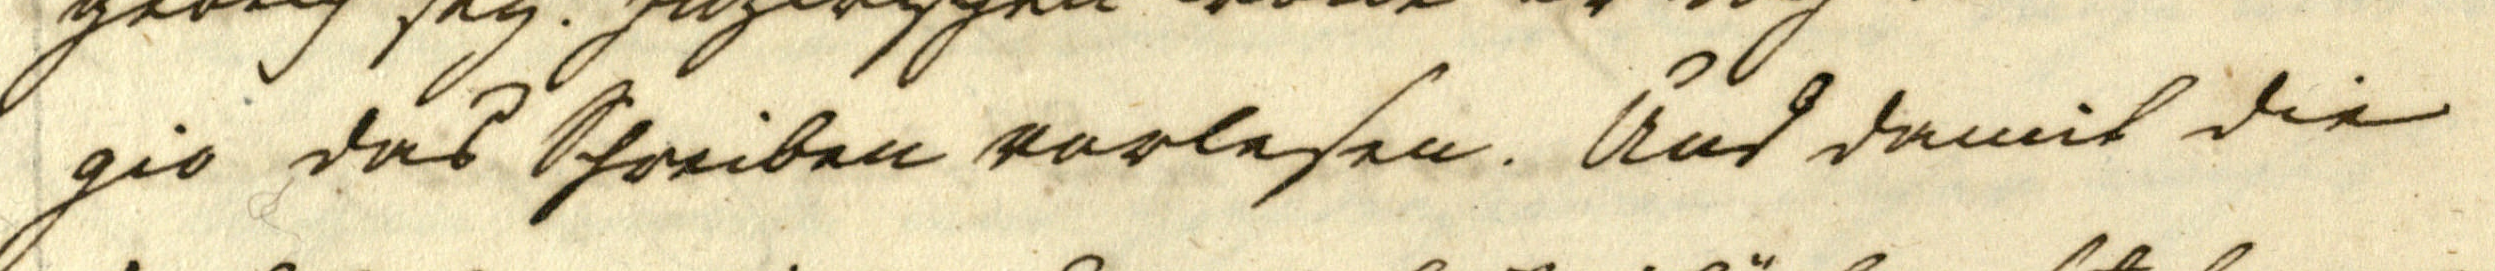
gio das Schreiben vorlesen. Und damit die
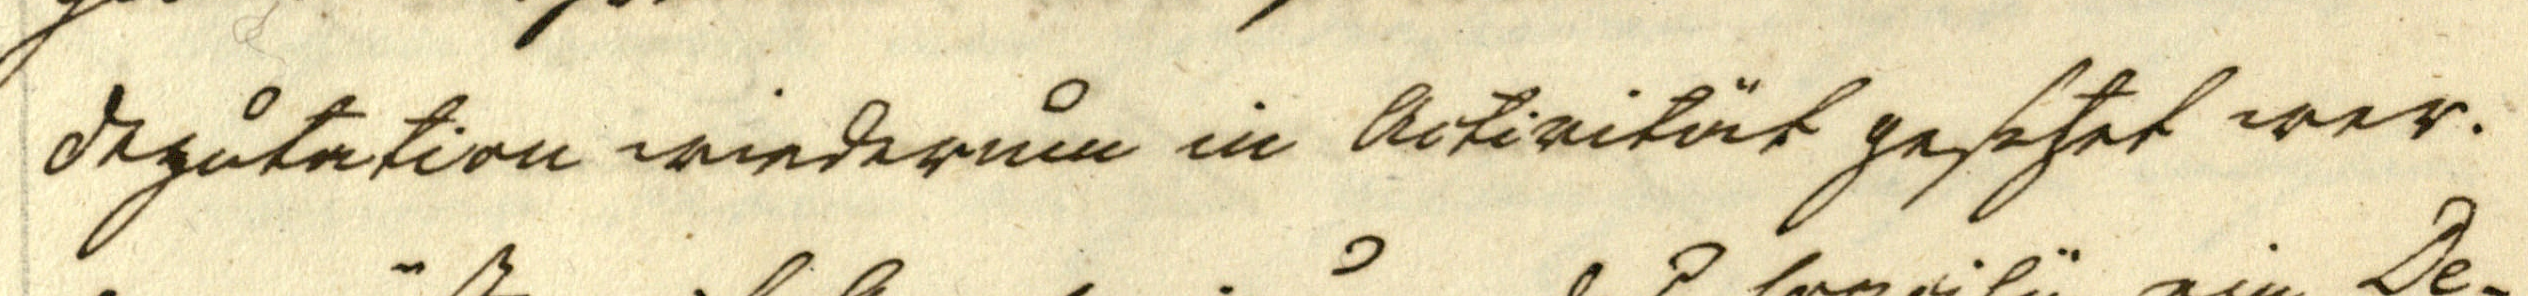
Deputation wiederum in Activität gesetzet wer¬
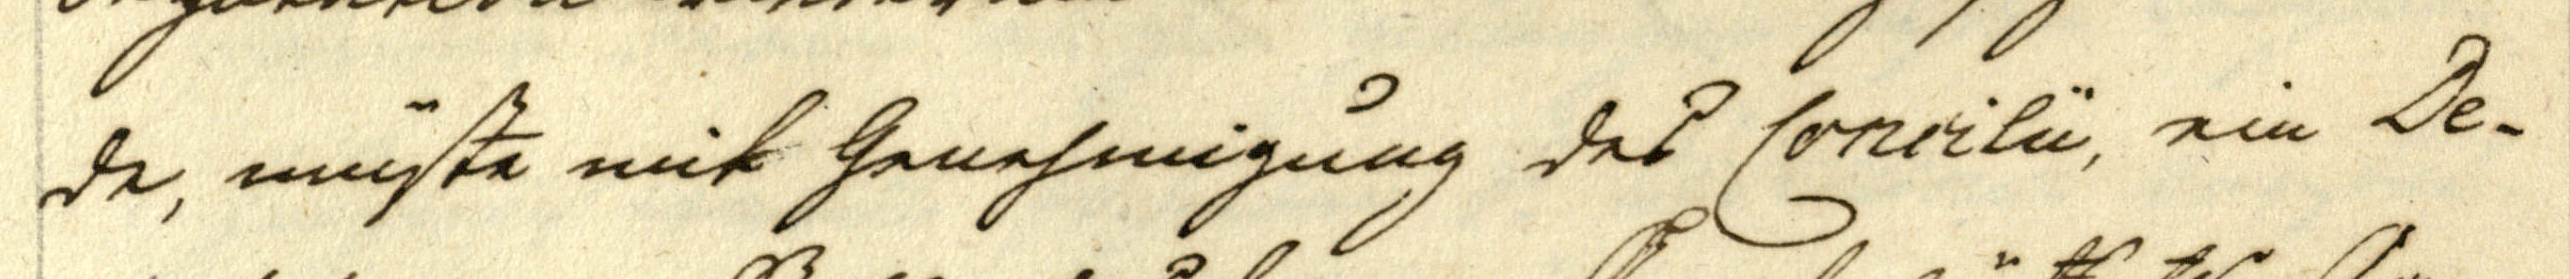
de, müßte mit Genehmigung des Concilii, ein De¬
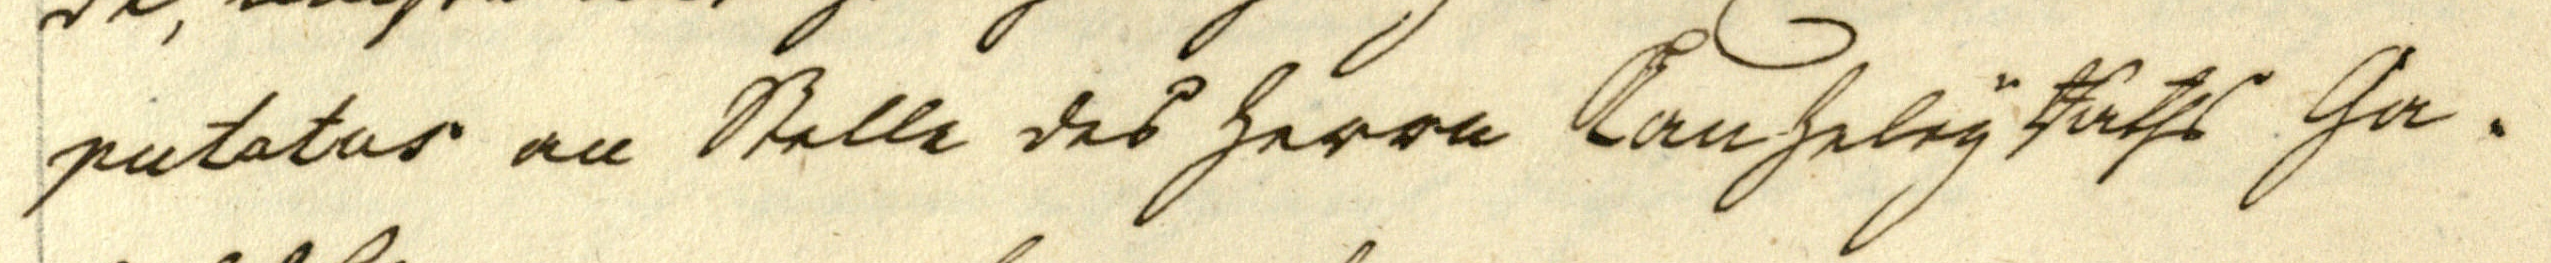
putatus an Stelle des Herrn Kanzeleÿ Raths Ga¬
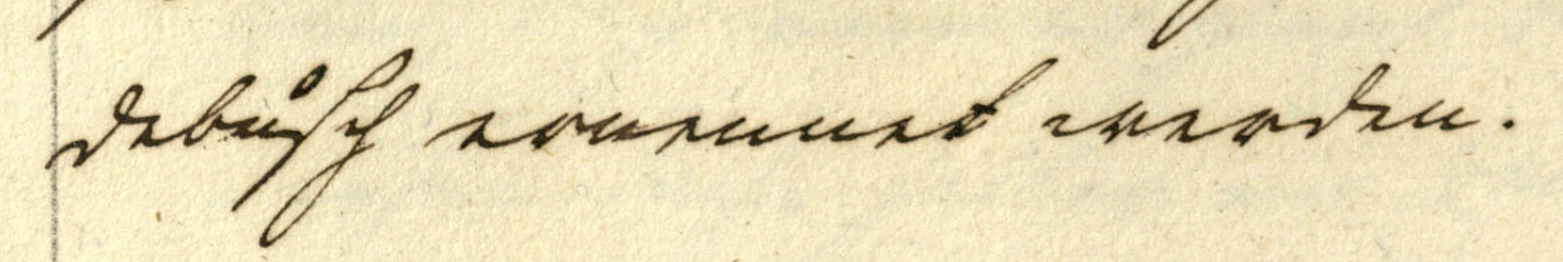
debusch ernennet werden.
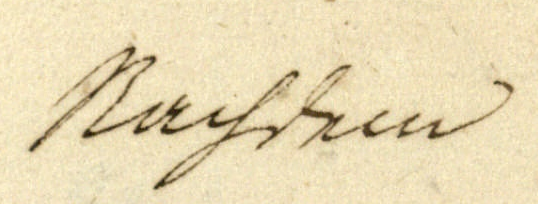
Nachdem
